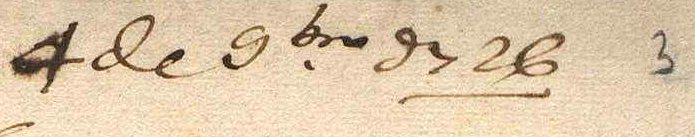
4 de 9.bro d̄ 726
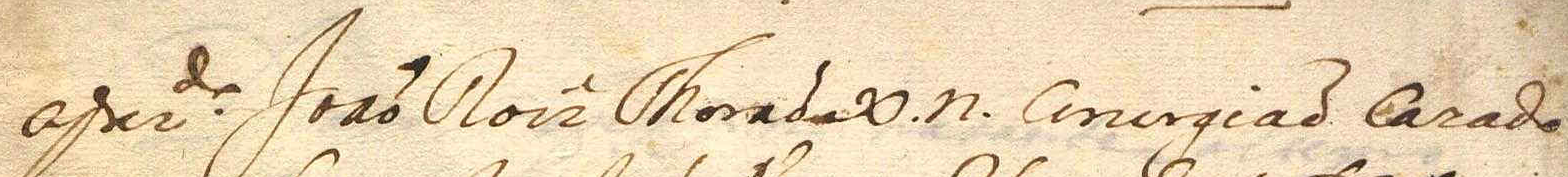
aprez.do Joaõ Roiz̄ Moraõ x. n. cirurgiaõ cazado
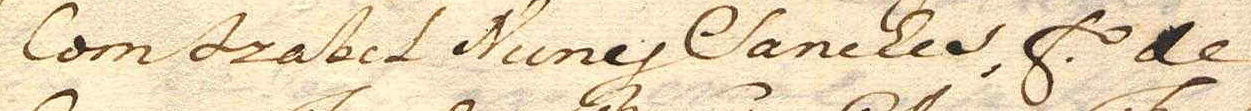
com Izabel Nunes Sanches, f.o de
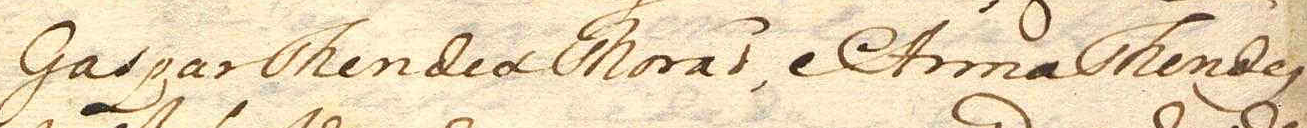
Gaspar Mendes Moraõ, e Anna Mendes
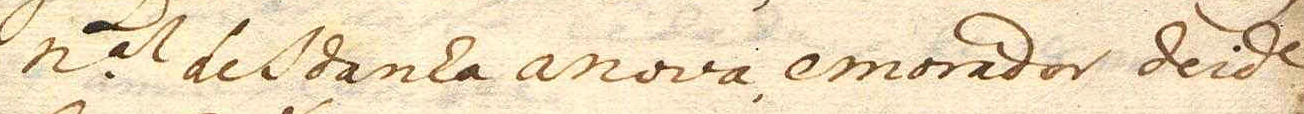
n.al de Idanha a nova, e morador de ide
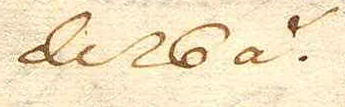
de 26 a.s
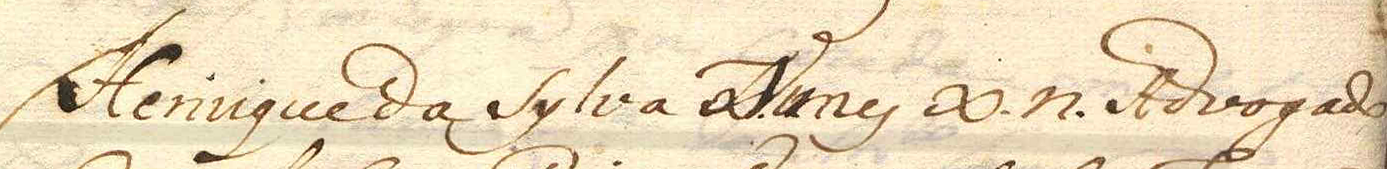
Henrique da Sylva Nunes x. n. Advogado
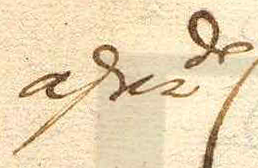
aprezdo
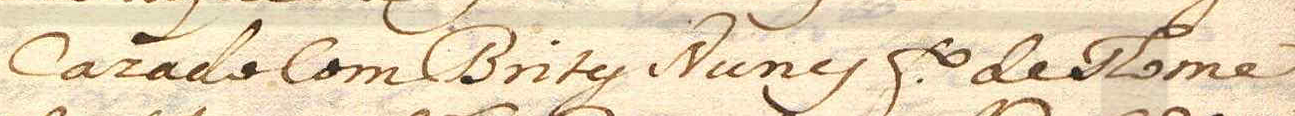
Cazado Com Brites Nunes f.o de Thome
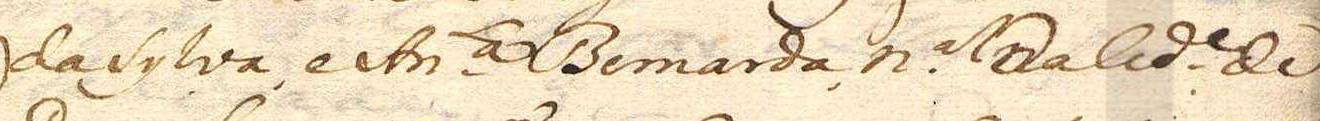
da Sylva, e An.ta Bernarda, n.al na Cid.e de
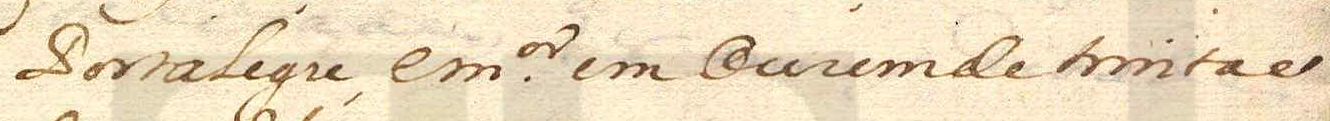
Portalegre, e m.or em Ourem de trinta e
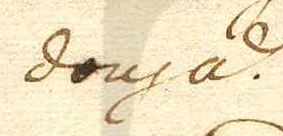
dous a.s
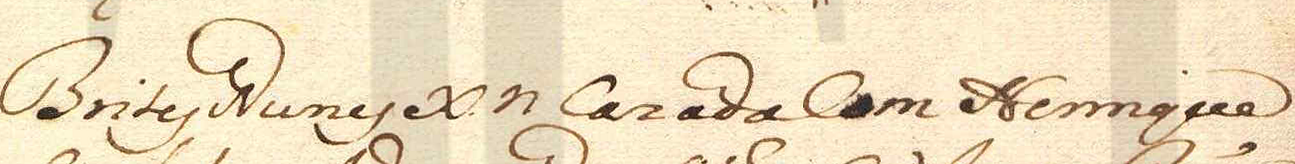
Brites Nunes x. n. cazada com Henrique
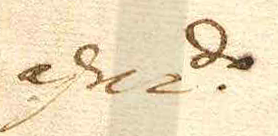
aprez.do
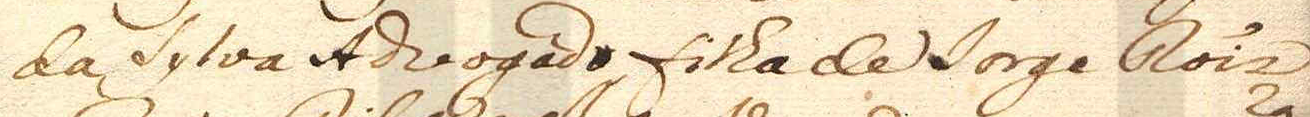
da Sylva Advogado filha de Iorge Roīz
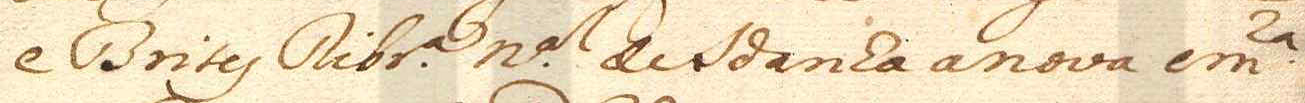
e Brites Ribr.a n.al de Idanha a nova e mra
